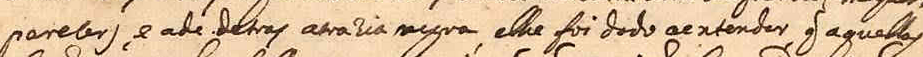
parecer) e a de detras a trazia negra, e lhe foi dado a entender q̄ aquellas
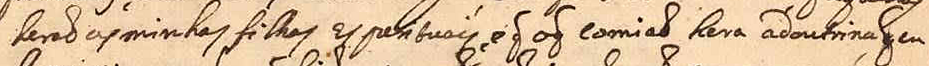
heraõ as minhas filhas Esperituaes, e q̄ o q̄ comiaõ hera a doutrina, q̄ eu
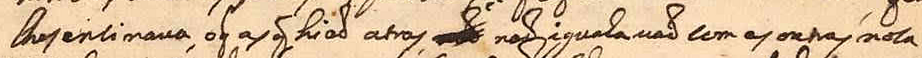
lhes ensinaua, o q̄ as q̄ hiaõ atras, naõ naõ igualauaõ com as outras no ca
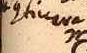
a q̄ tiuera
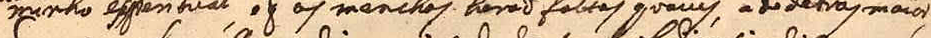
minho esperitual, e q̄ os manchas heraõ faltas graues, a de detras maior
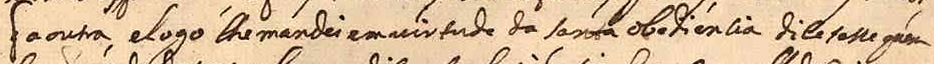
q̄ a outra, e logo lhe mandei em a uirtude da santa obediencia dicesesse quem
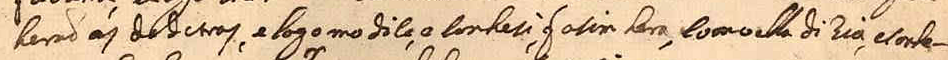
heraõ as de detras, e logo mo dice, e conhesi q̄ asim hera, Como ella dizia, e conhe
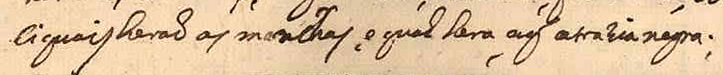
Ci quais heraõ as manchas, e qual hera a q̄ a trazia negra;
